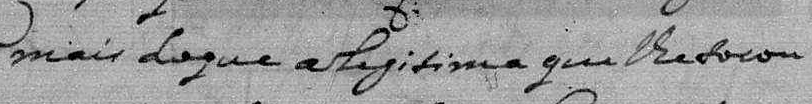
mais do que a Legitima que lhe tocou
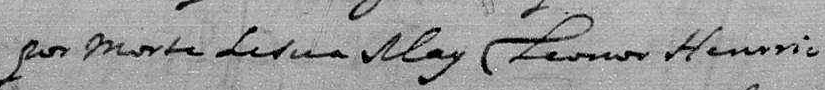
por morte de sua May Leonor Henrri
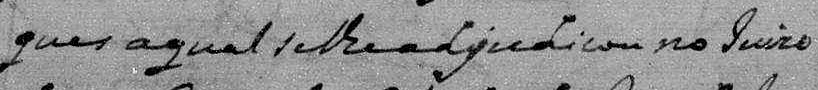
ques a qual se lhe adjudicou no Iuizo
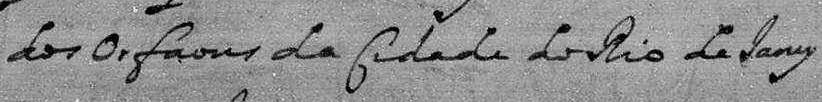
dos Orfaons da Cidade do Rio de Ianey
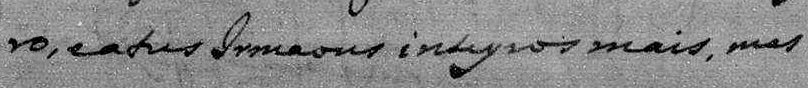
ro, e a tres Irmaons inteyros mais, mas
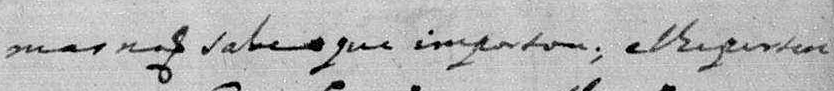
mas naõ sabe o que importou; e lhe perten
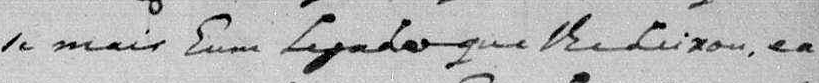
se mais hum Legado que lhe deixou, e a
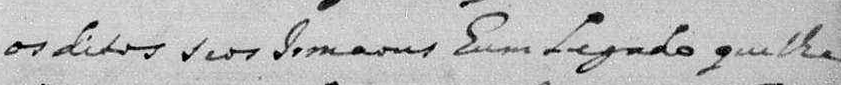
os ditos seos Irmaons hum Legado que lhe
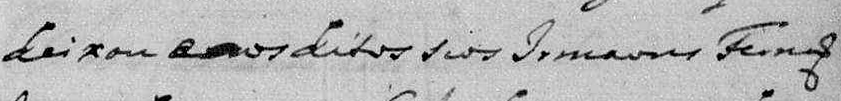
deixou e aos ditos seos Irmaons Fernaõ
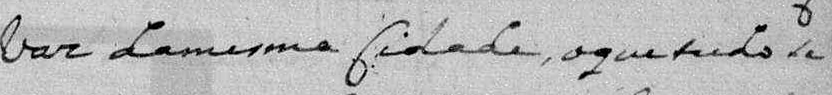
Vaz da mesma Cidade, o que tudo se
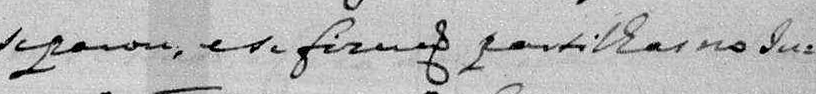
separou, e se fizeraõ partilhas no Iui
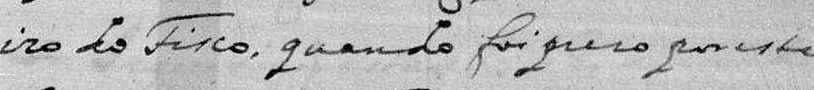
izo do Fisco, quando foi prezo por este
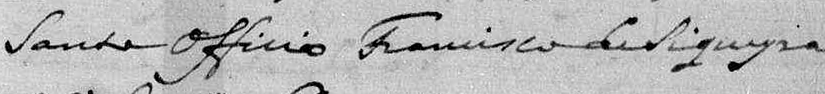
santo officio Francisco de siqueyra
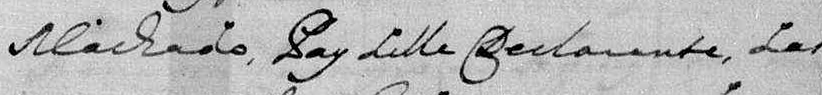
Machado, Pay delle Declarante, das
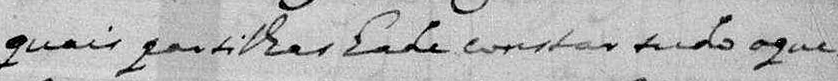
quais partilhas ha de constar tudo o que
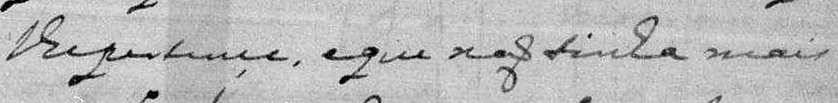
lhe pertence, e que naõ tinha mais
